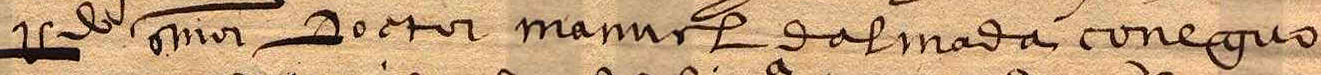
Rdo s̄nor Doctor manueL dalmada coneguo
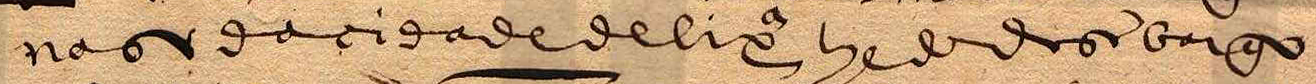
na se da cidade de lixa he do desēbargo
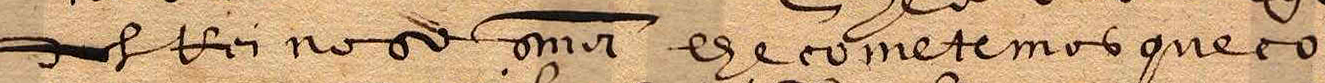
del Rei noso s̄nor lhe cometemos que co
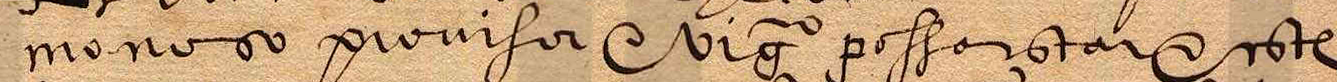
mo noso prouisor e vigro possa estar ē este
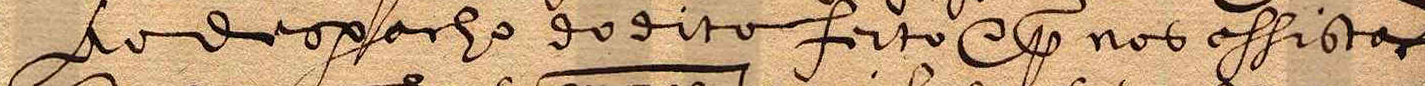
Ao despacho do dito feito e p̄o nos assista
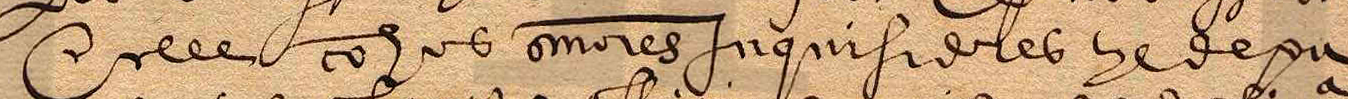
ē elle c̄o hos s̄enores Jnquisidores he depu
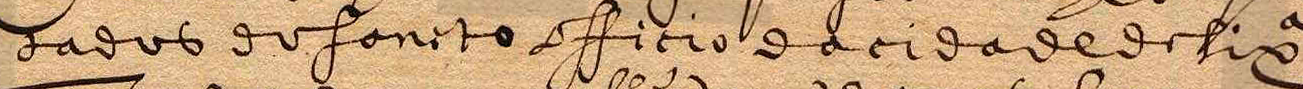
tados do sancto officio da cidade de lixa
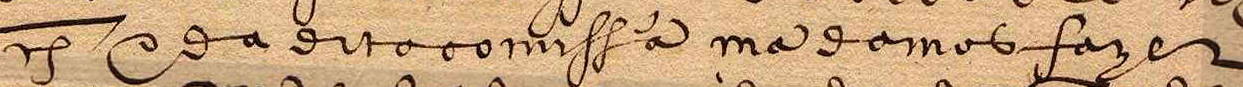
c̄ꝭ / e da dita comissā mādamos fazer
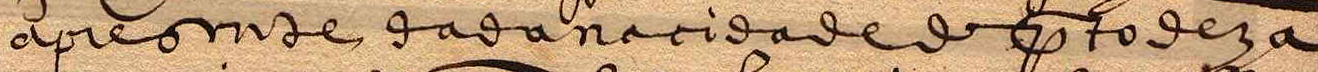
a presente dada na cidade do p̄to deza
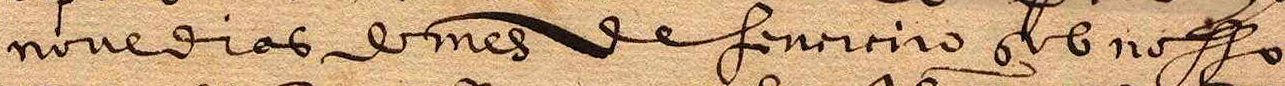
noue dias do m̄es de feuereiro sob nosso
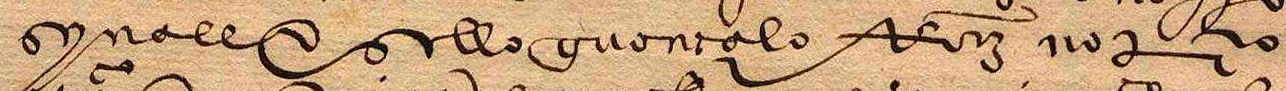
synall e sello guonçalo Rōiz notrro
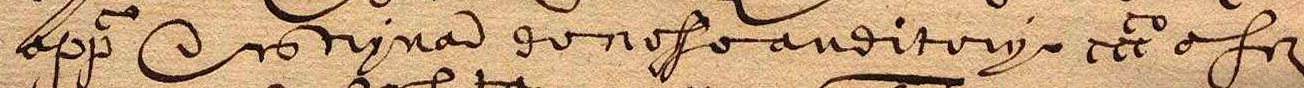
appco e escryuā do nosso auditoryo eccco a fez
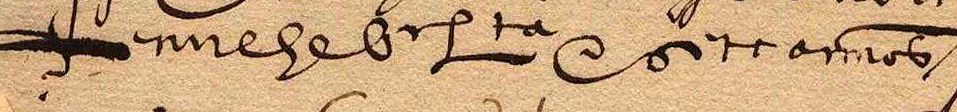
de mil he bc Lta e sete an̄nos /
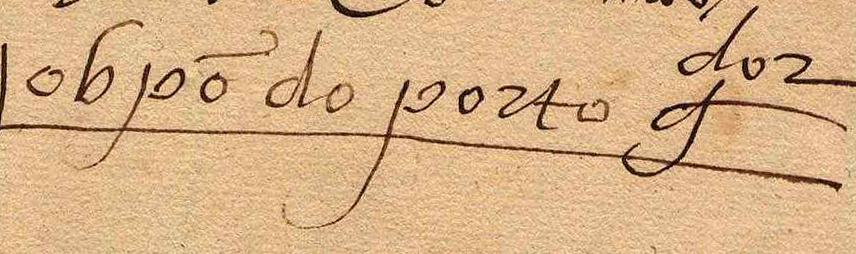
o bpō do porto gdor
